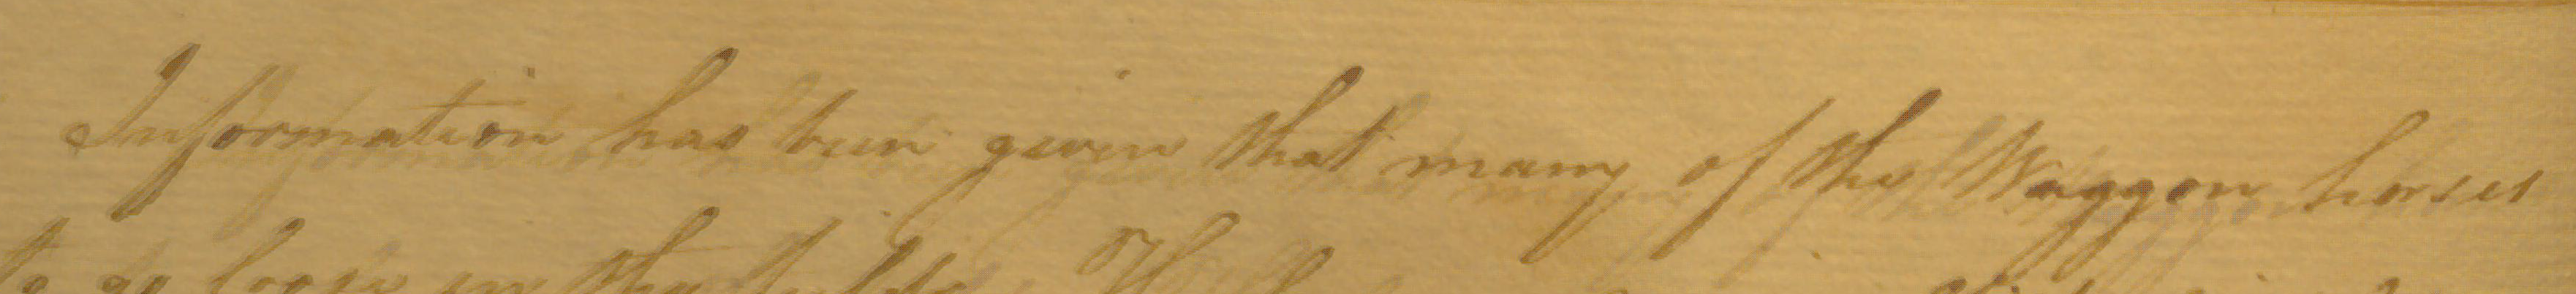Information has been given that many of the Waggon horses
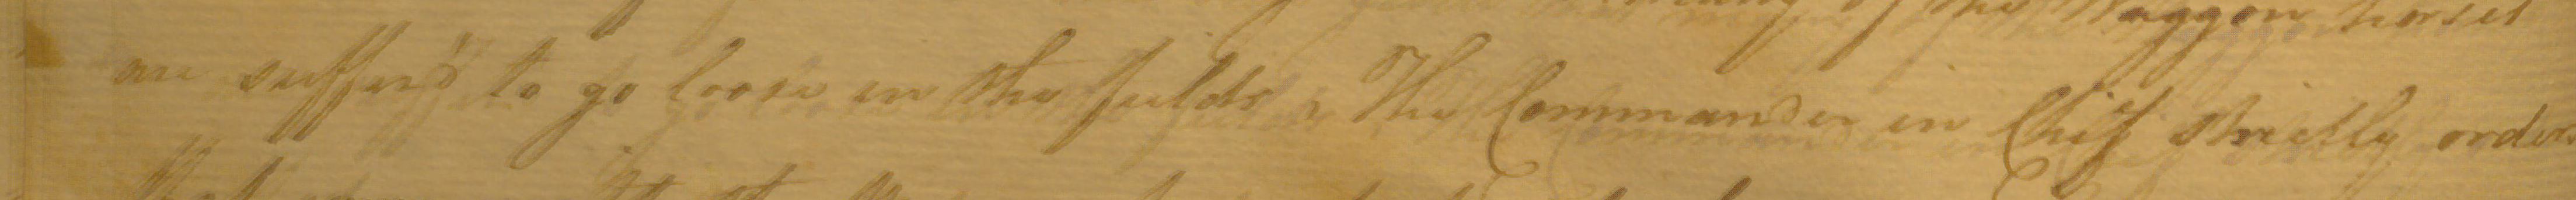are sufferd to go loose in the fields, The Commander in Chief strictly orders
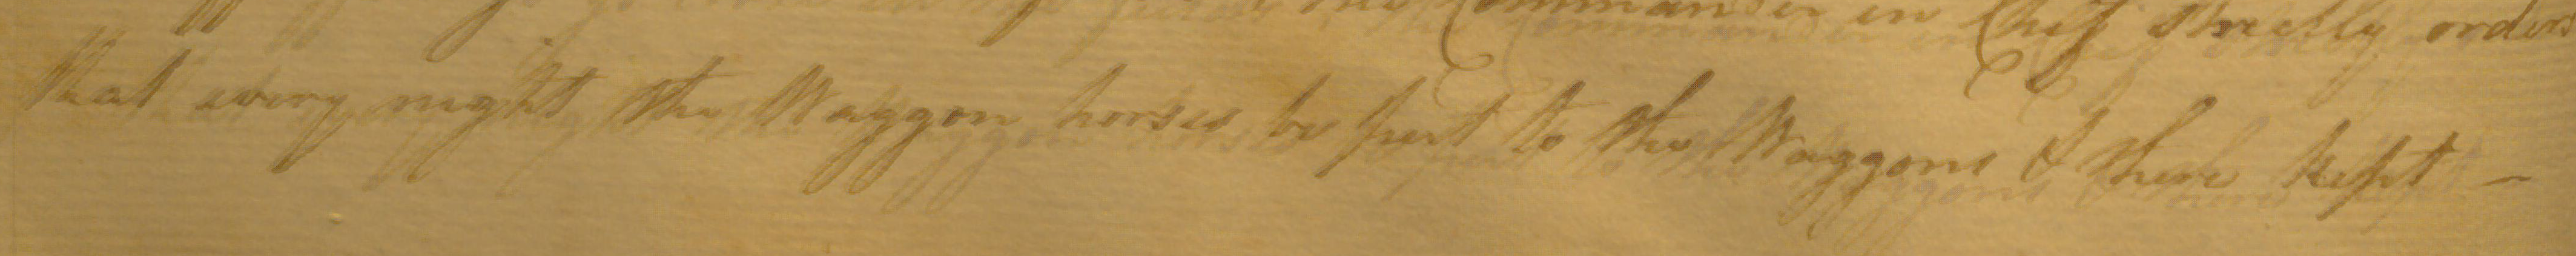that every night the Waggon horses be put to the Waggons & there kept-
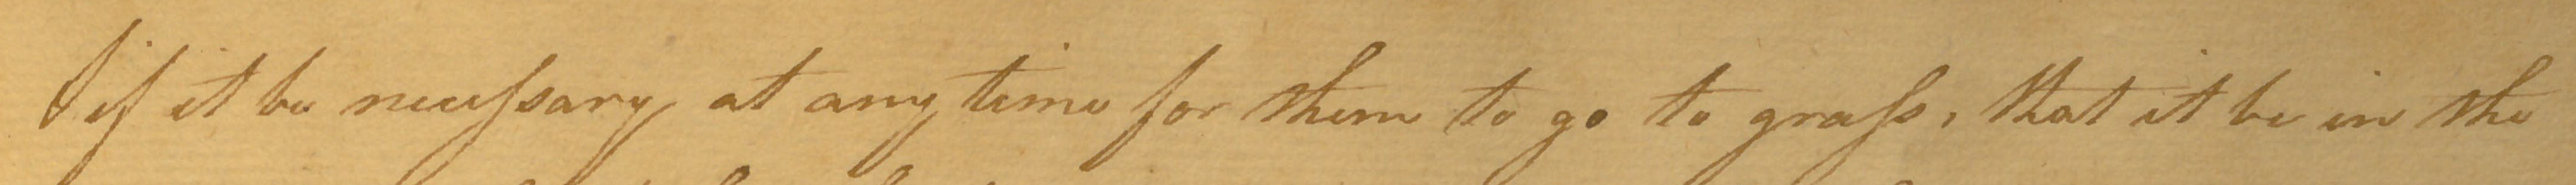& if it be necessary at any time for them to go to grass, that it be in the
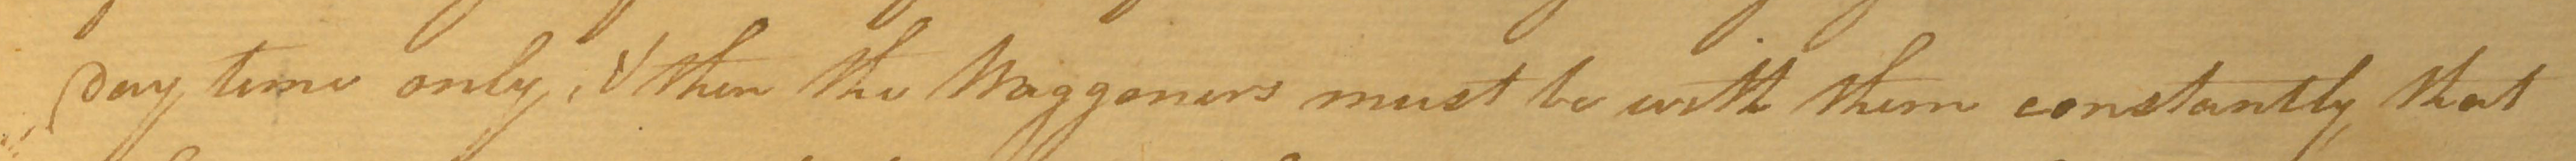day time only, & then the Waggoners must be with them constantly that
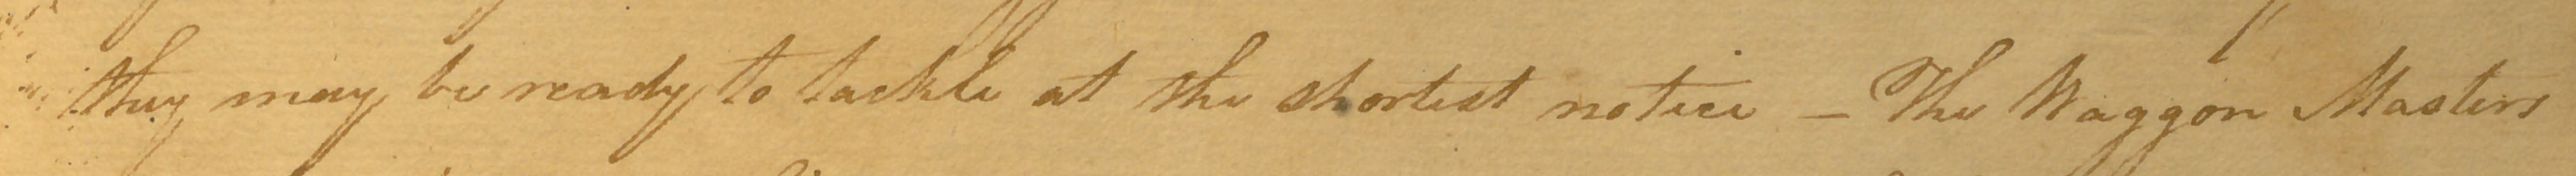they may be ready to tackle at the shortest notice- The Waggon Masters
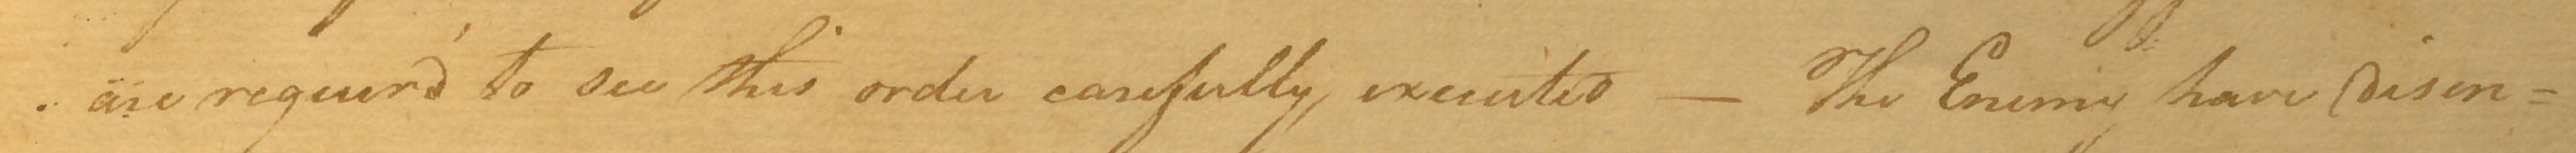are required to see this order carefully executed- The Enemy have disen-
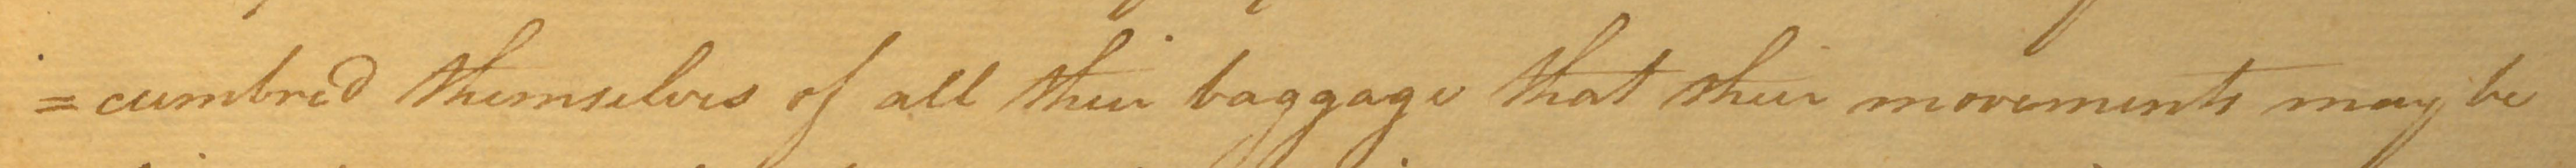-cumbred themselves of all their baggage that their movements may be
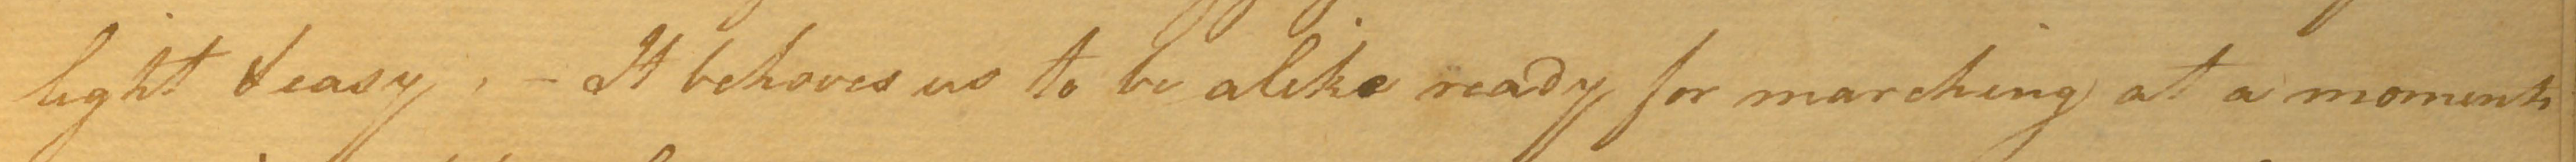light & easy, - It behoves us to be alike ready for marching at a moments
